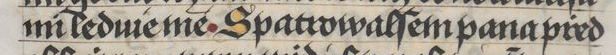mi leduíe me.Spatrowalſem pana pṙed
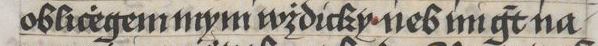obličegem mym wżdicky.neb mi ḡt na¬
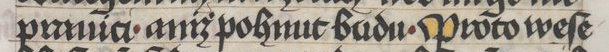pravici.aniż pohnut budu.Proto weſe¬
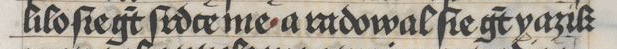lilo ſie ḡt ſrdce me.a radowal ſie ḡt yazik
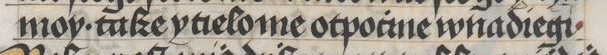moy.take y tielo me otpocżne wnadiegi.
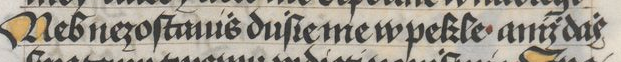Neb nezoſtavíṡ duẛie me w pekle.aniż daṡ
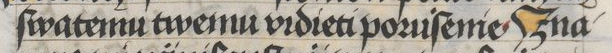ſwatemu twemu vidieti poruẛeníe.Zna¬
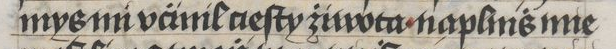mys mi uċinil cieſty żiwota.naplniṡ me
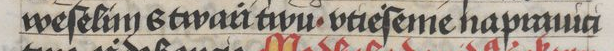weselim s twaṙí twu.utieẛeíe na pravici
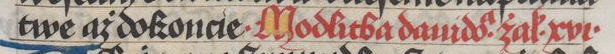twe aż dokoncie.Modlitba davidoa.žal.xvi.
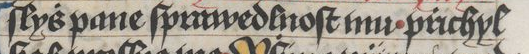ſlyṡ pane ſprawedlnoſt mu.pṙichyl
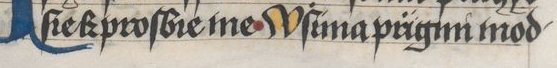ſie bie me.Uẛima pṙigmi mod¬
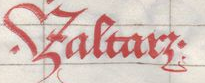.Żaltarz.
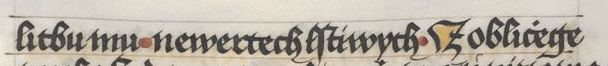litbu mu.newertech lſtiwych.Z obliċege
